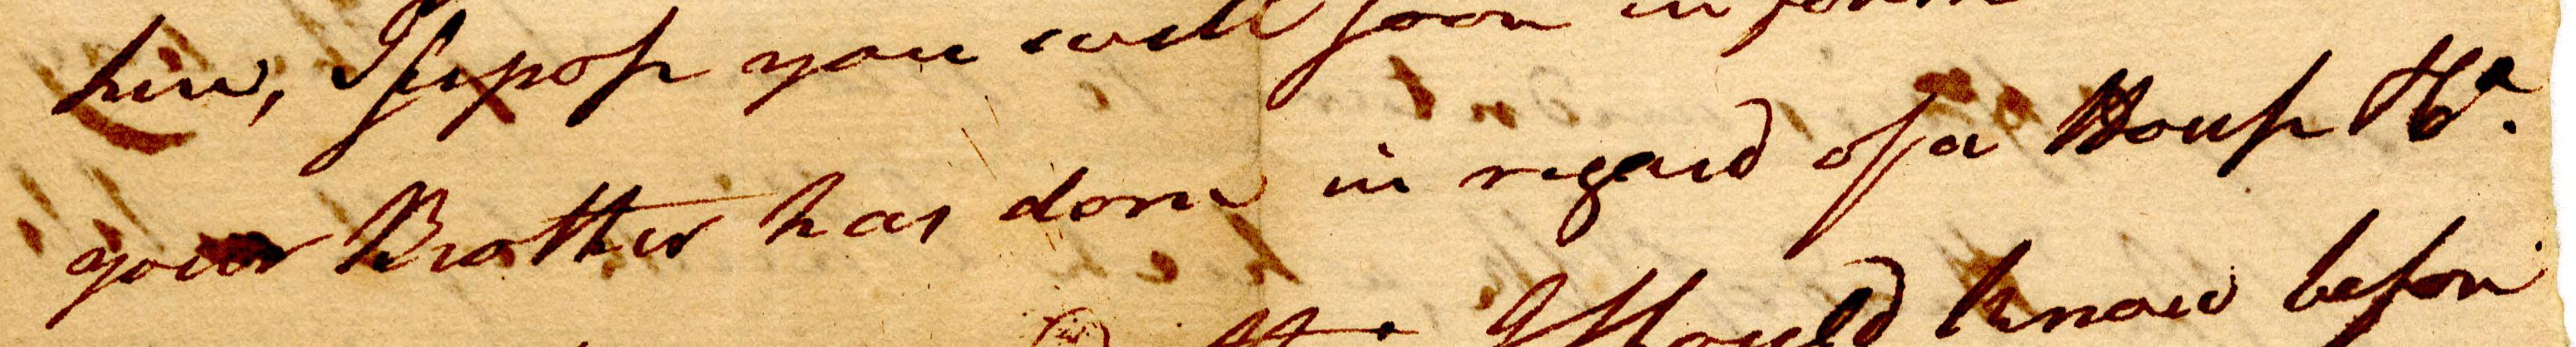your Brother has done in regard of a House &c^a
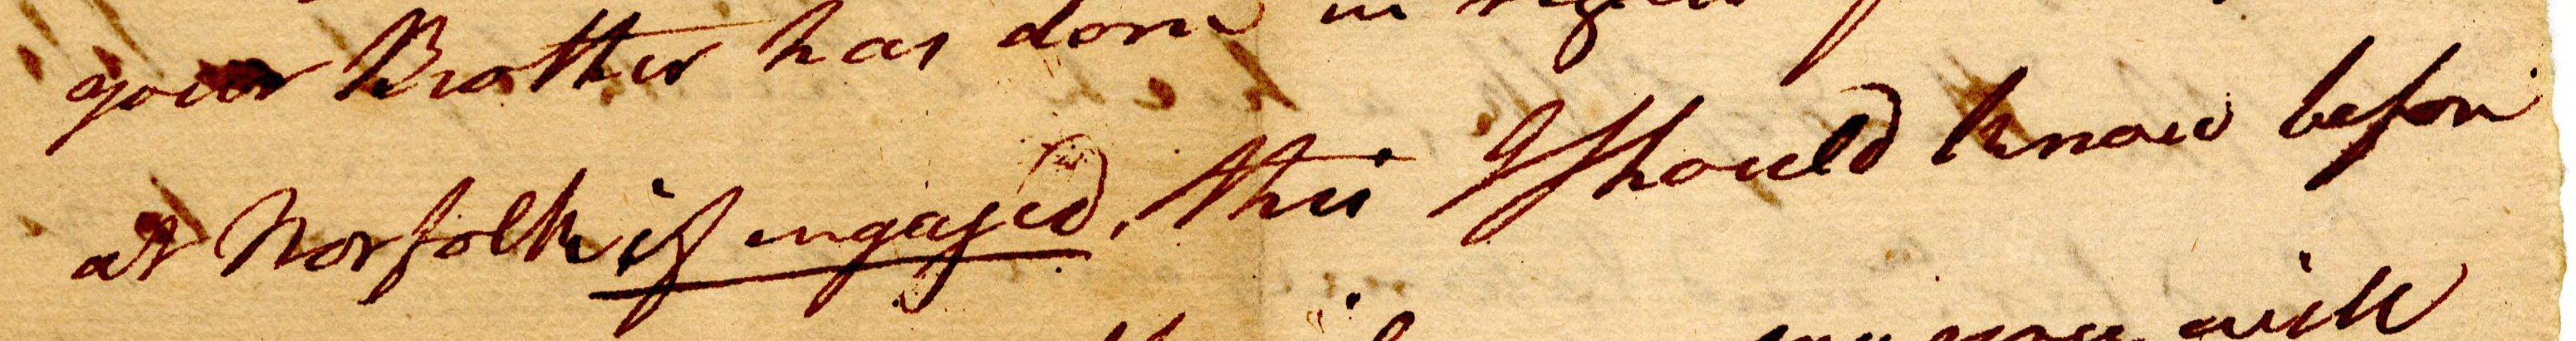at Norfolk if engaged this I should know before
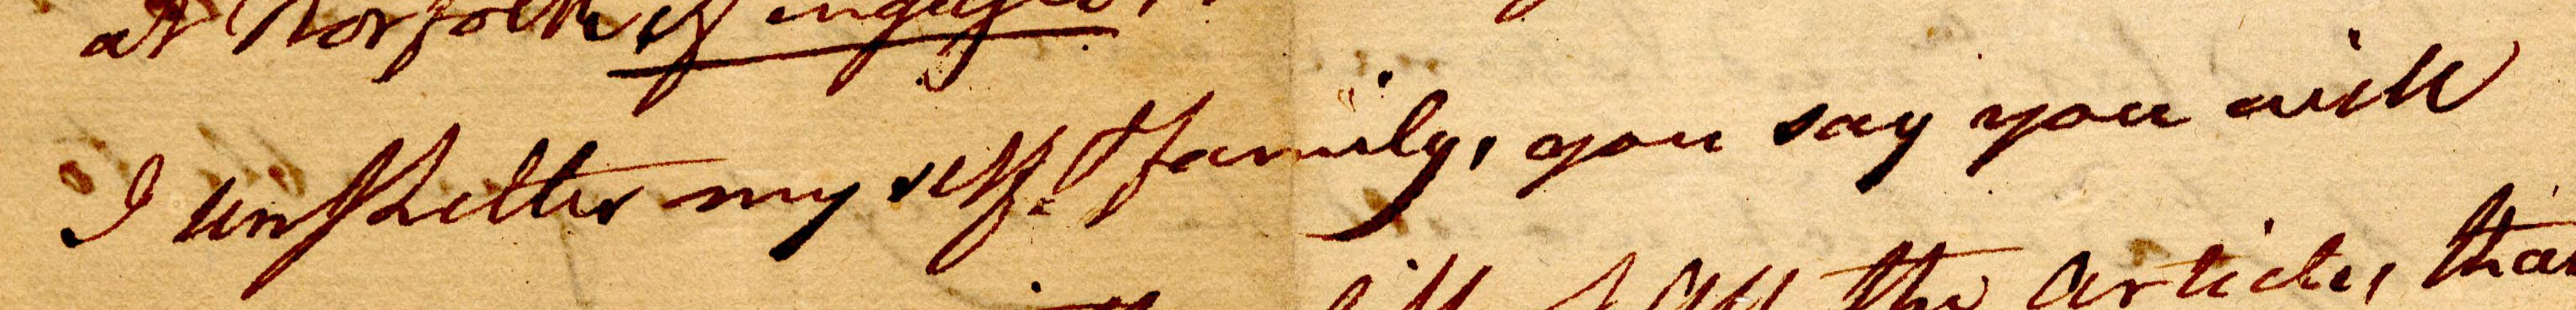I unshelter my self & family, you say you will
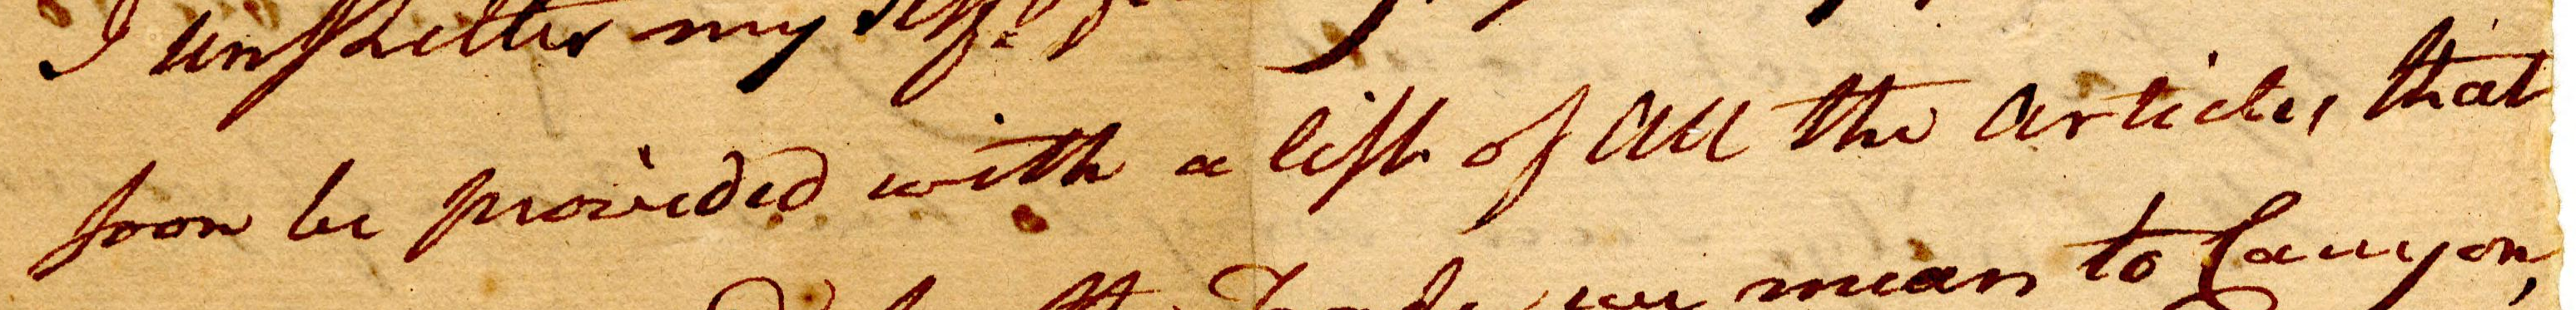soon be provided with a list of All the Articles that
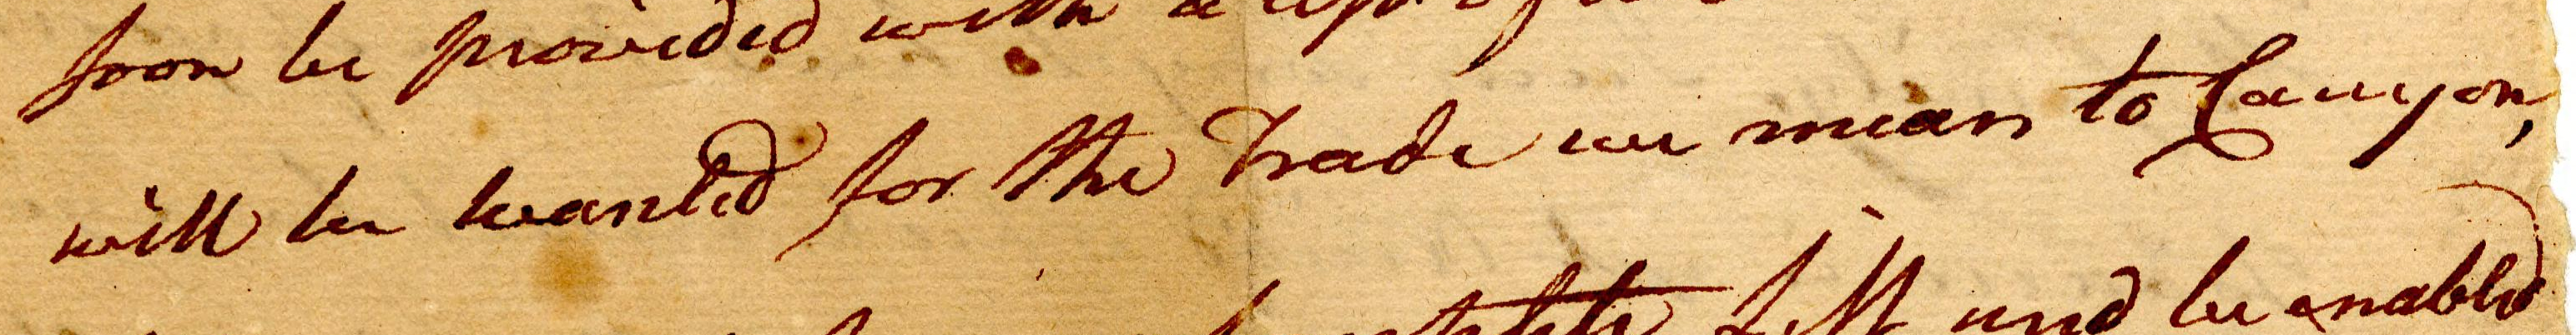will be wanted for the Trade we mean to Carry on,
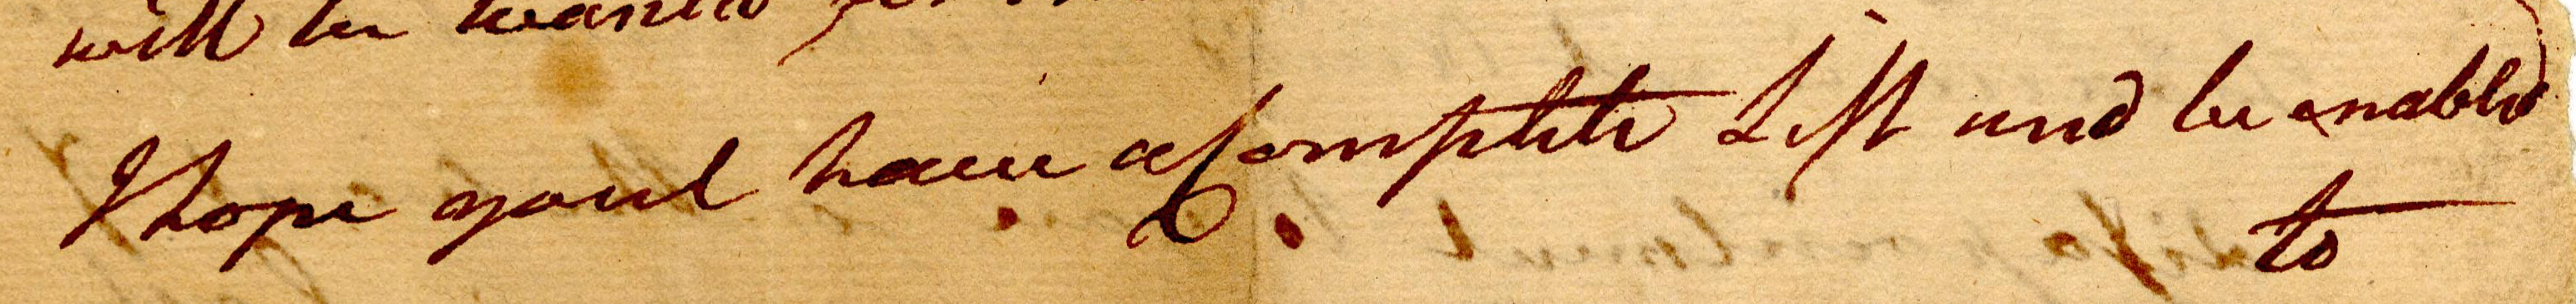I hope youl have a complete List and be enabled
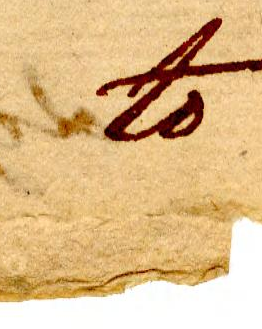to
